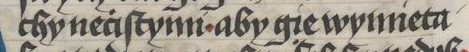chy neċiſtymi.aby gie wymieta¬
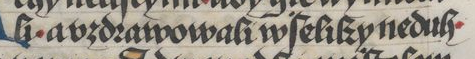li.a vzdrawowali wẛeliky neduh.
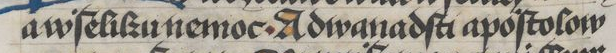a wẛeliku nemoc.A dwanadſti apoẛtolow
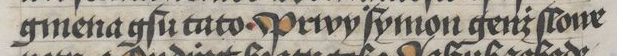gmena gſu tato.Prwy ẛymon genż ſlowe
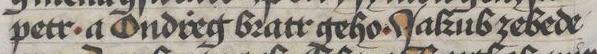petr.a Ondṙeg bratr geho.Jakub zebede¬
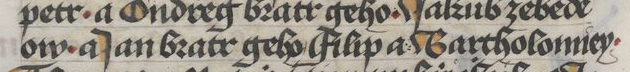ow.aJan bratr Filip a Bartholomiey.
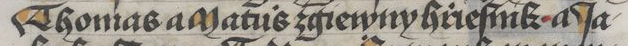Thomas a Matuṡ zgiewny hṙieẛnik.aJa¬
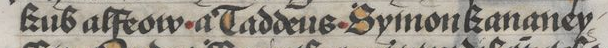kub alfeow.a Taddeus.Ṡymon kananey¬
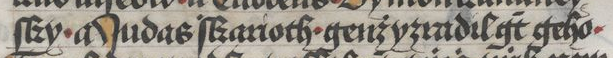ſky.aJudas ẛkarioth.genž yzradil ḡt geho.
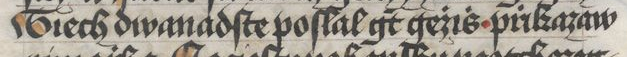Tiech dwanadſte poſlal ḡt geżiṡ.pṙikazaw
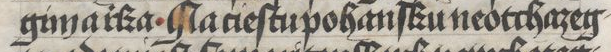gim a ṙka.Na cieſtu pohanſku neotchazeg¬
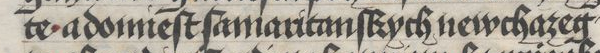te.a domieſt ſamaritanſkych newchazeg¬
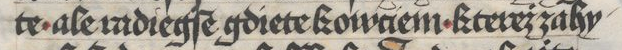te.ale radiegẛe gdiete kowciem.ktereż zahy¬
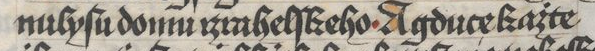nulyſu domu izrahelſkeho.A gduce każte
